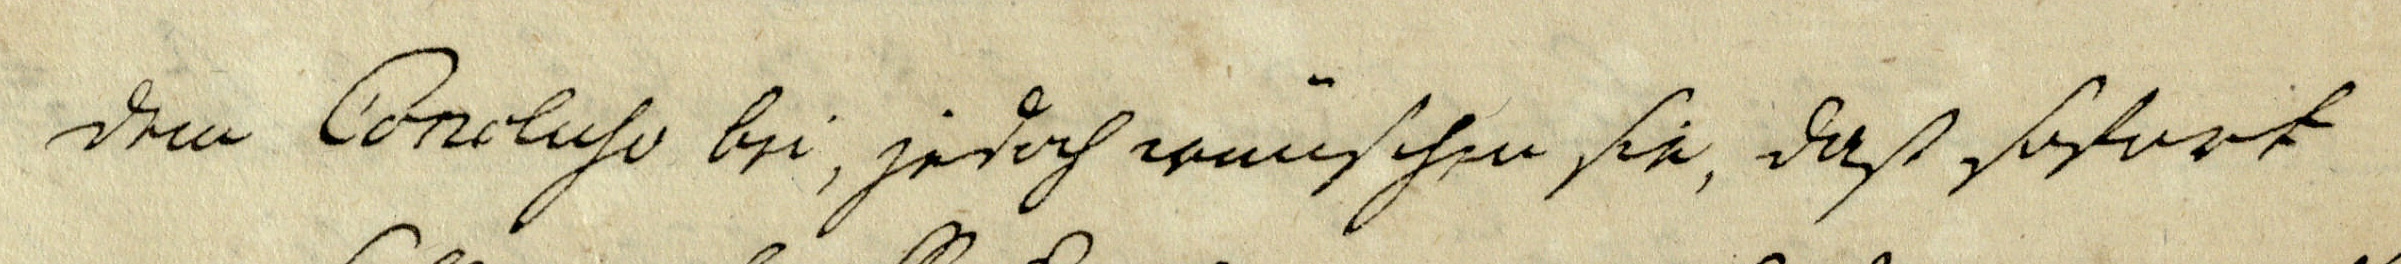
dem Concluso bei, jedoch wünschen sie, daß sofort
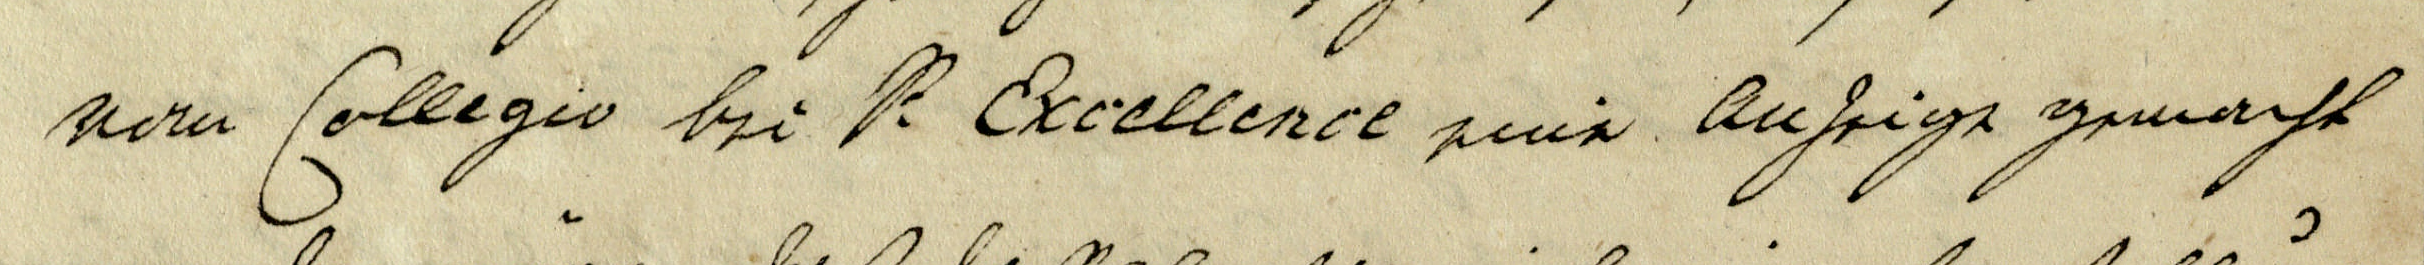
vom Collegio bei Sr Excellence eine Anzeige gemacht
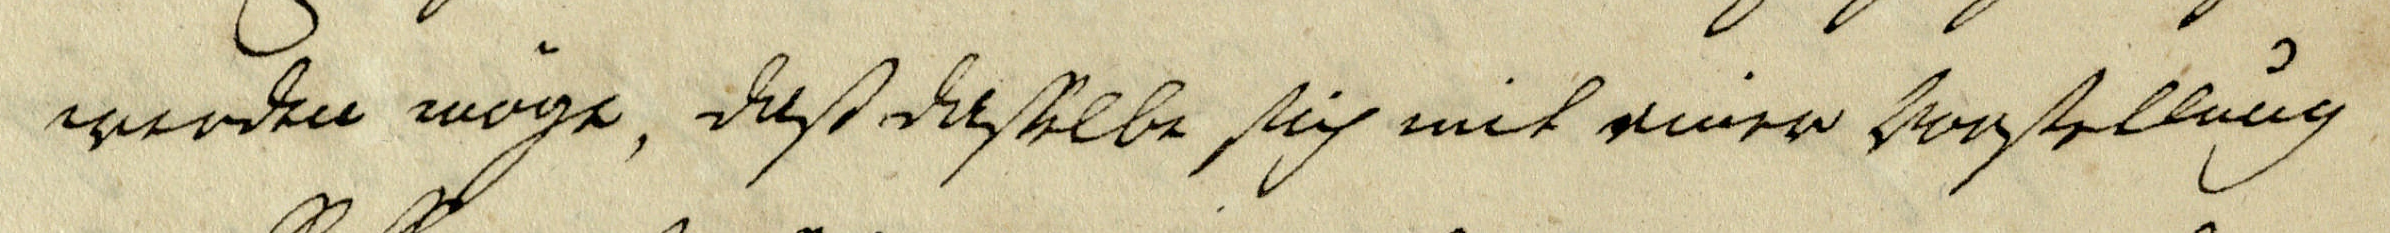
werden möge, daß dasselbe sich mit einer Vorstellung
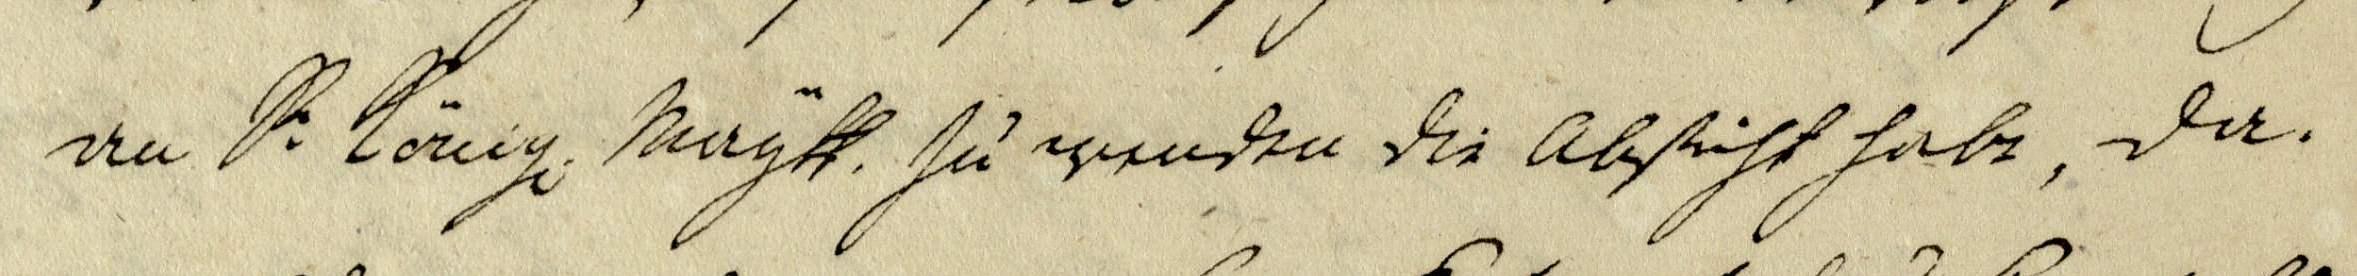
an Sr. Königl. Maÿtt. zu wenden die Absicht habe, da¬
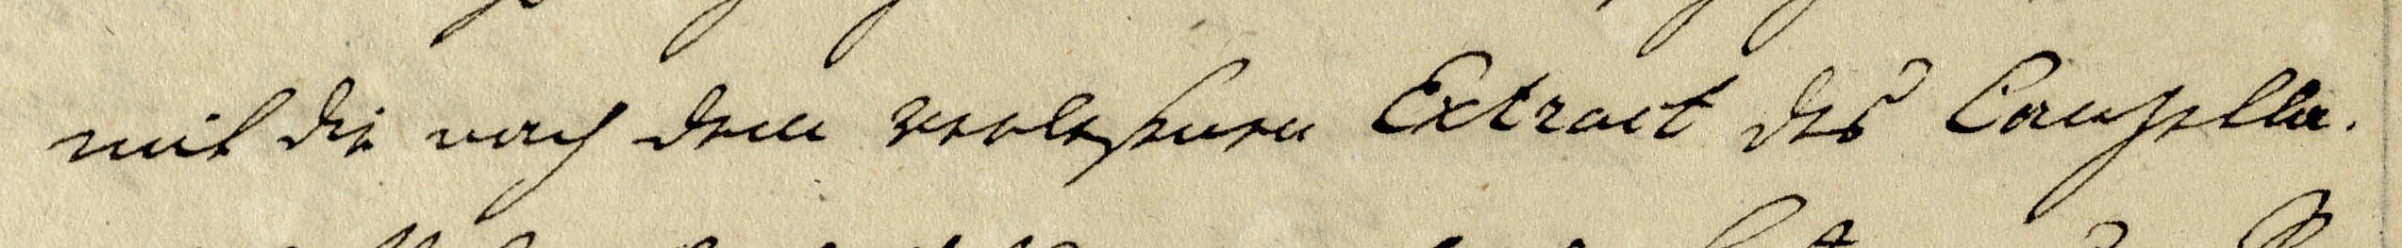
mit die nach dem verlesenen Extract des Canzella¬
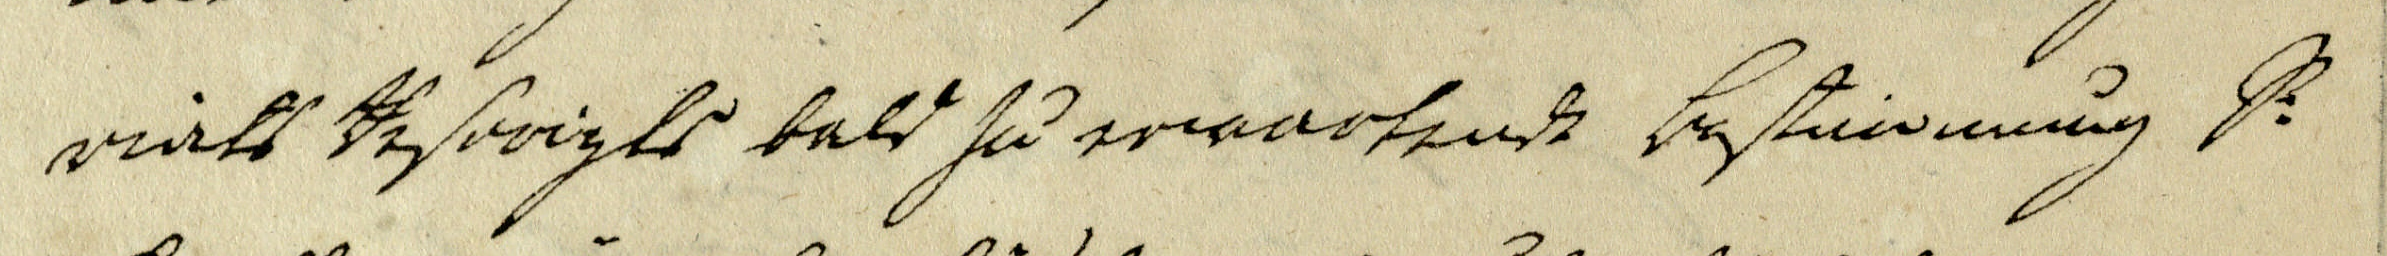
riats Rescripts bald zu erwartende Bestimmung Sr.
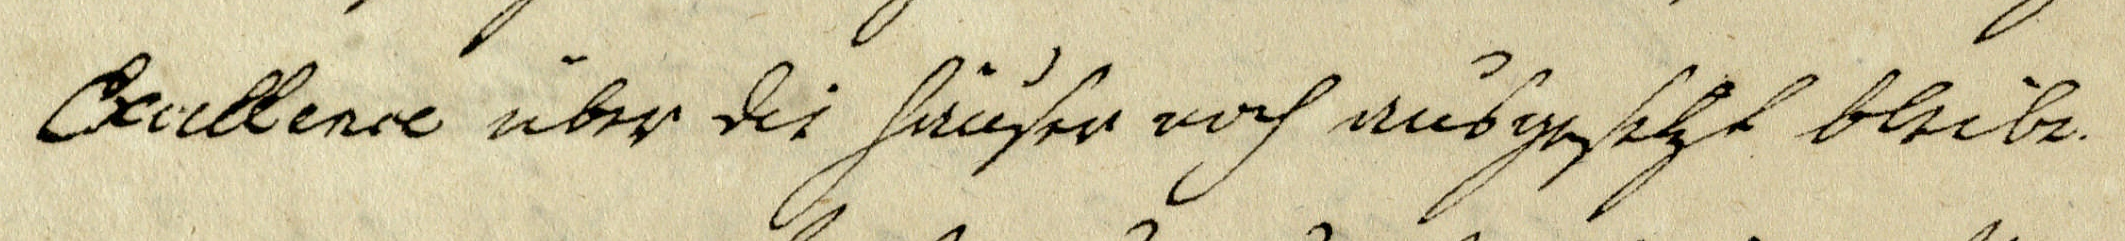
Excellence über die Häuser noch ausgesetzt bleibe.
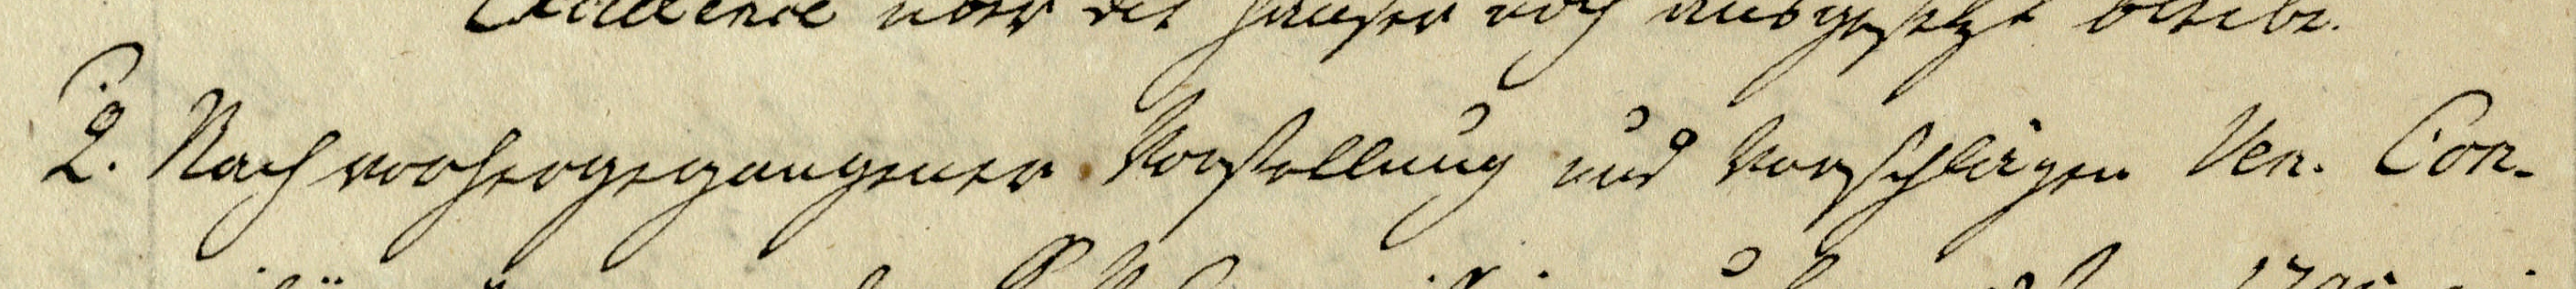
2. Nach vorhergegangener Vorstellung und Vorschlägen Ven. Con¬
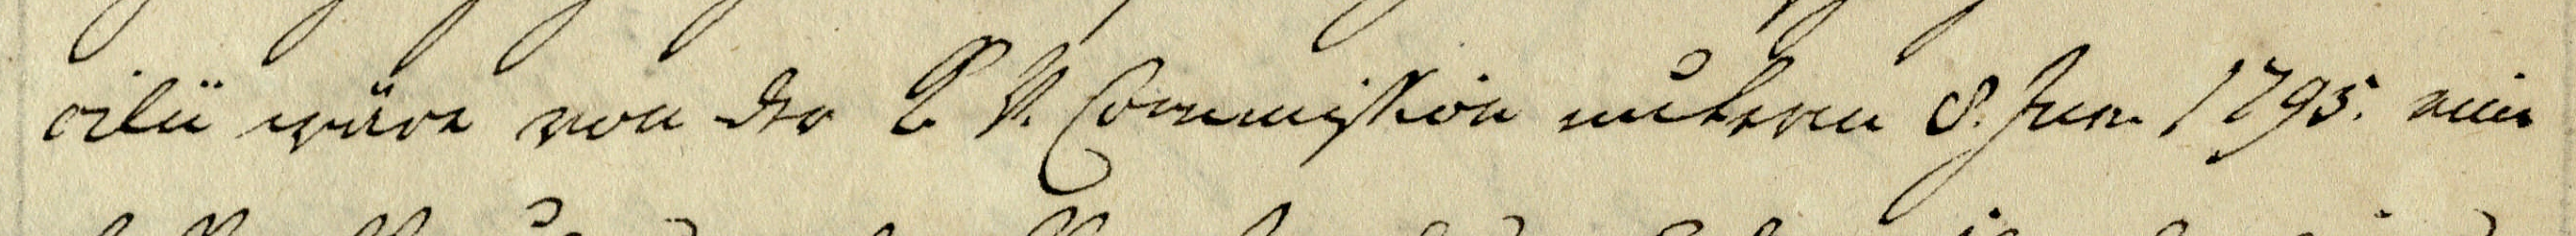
cilii wäre von der K. R. Commission unterm 8. Jun. 1795. eine
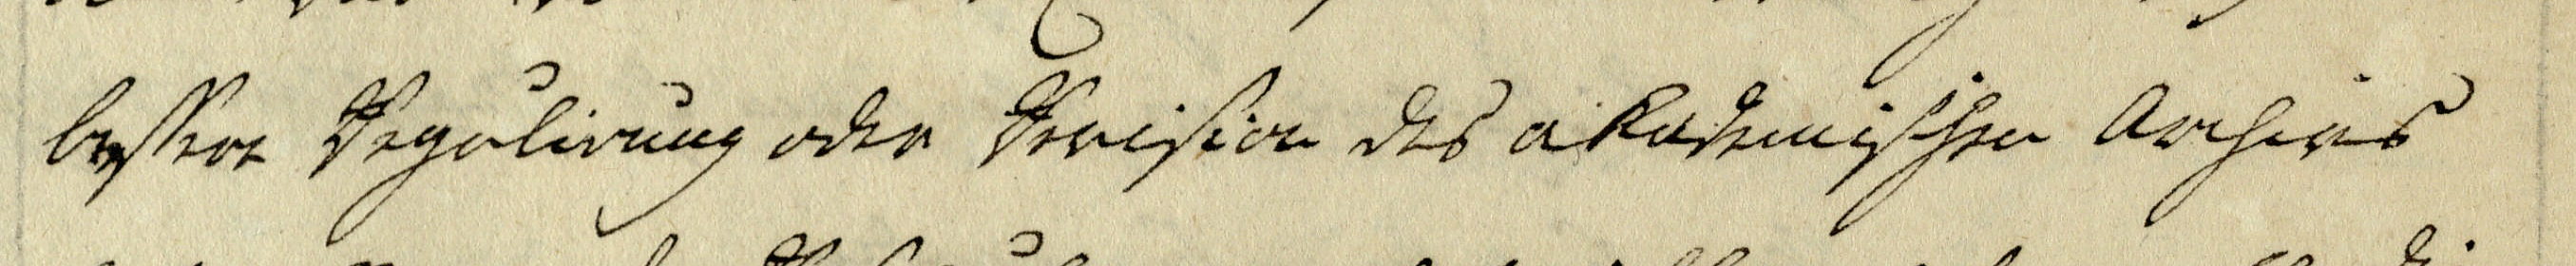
bessere Regulirung oder Revision des akademischen Archivs
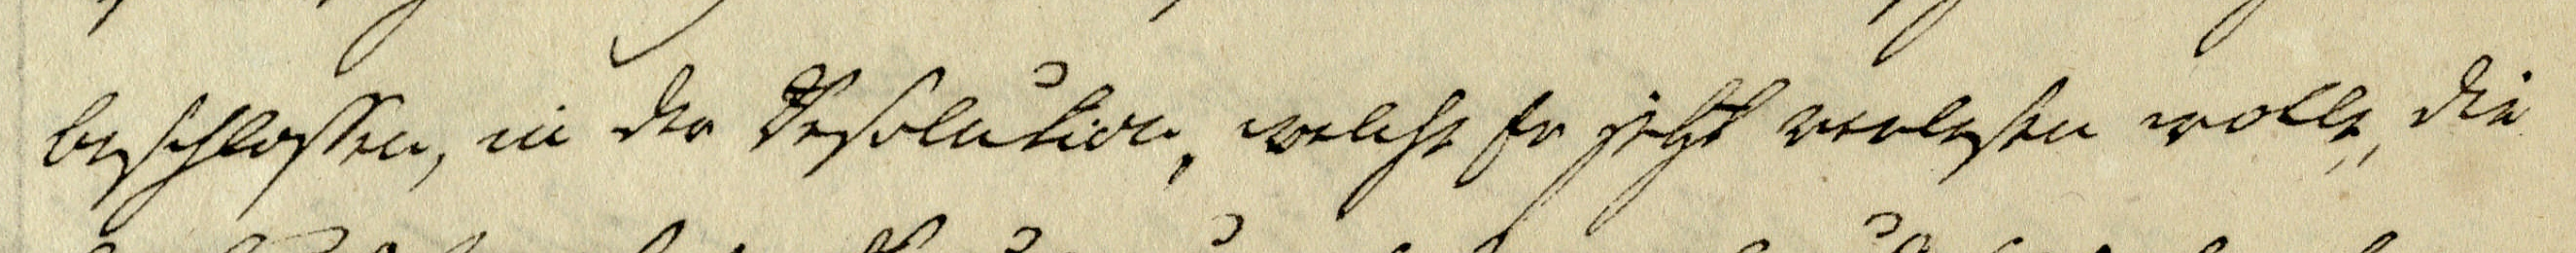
beschlossen, in der Resolution, welche Er jetzt verlesen wolle, die
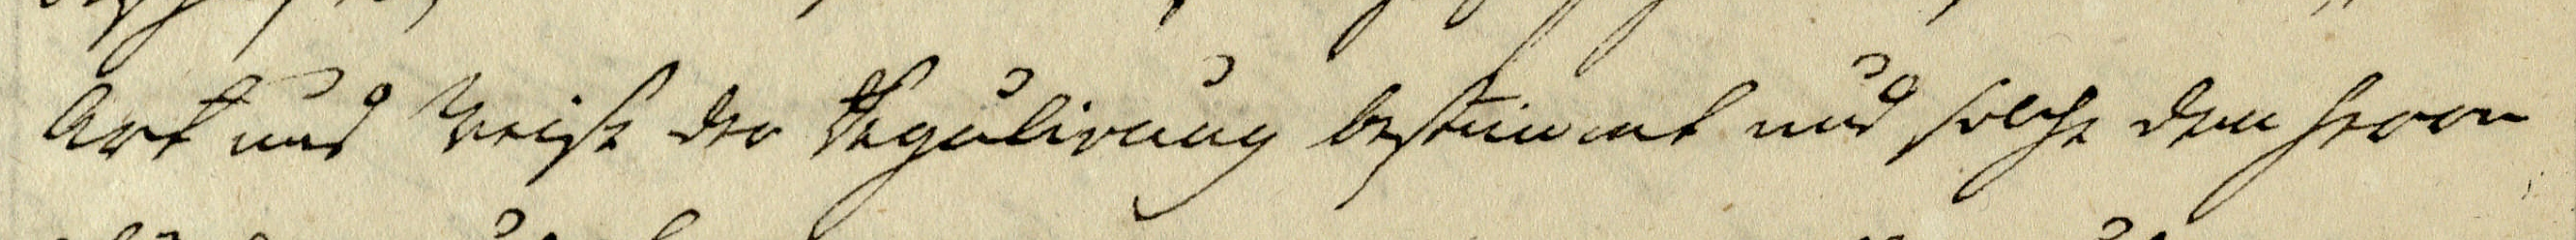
Art und Weise der Regulirung bestimmt und solche dem Herrn
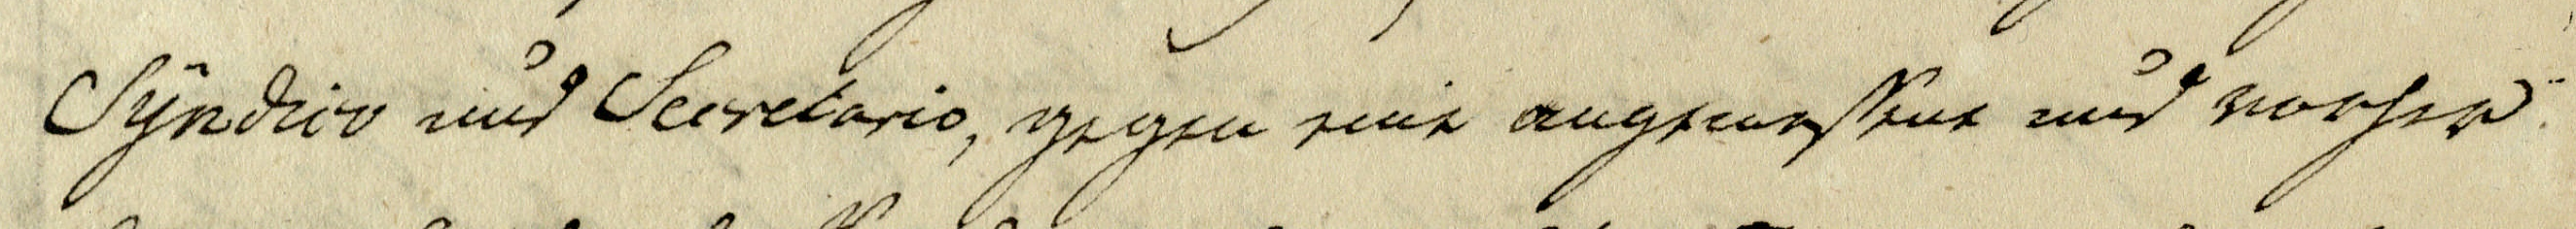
Sÿndico und Secretario, gegen eine angemessene und vorher
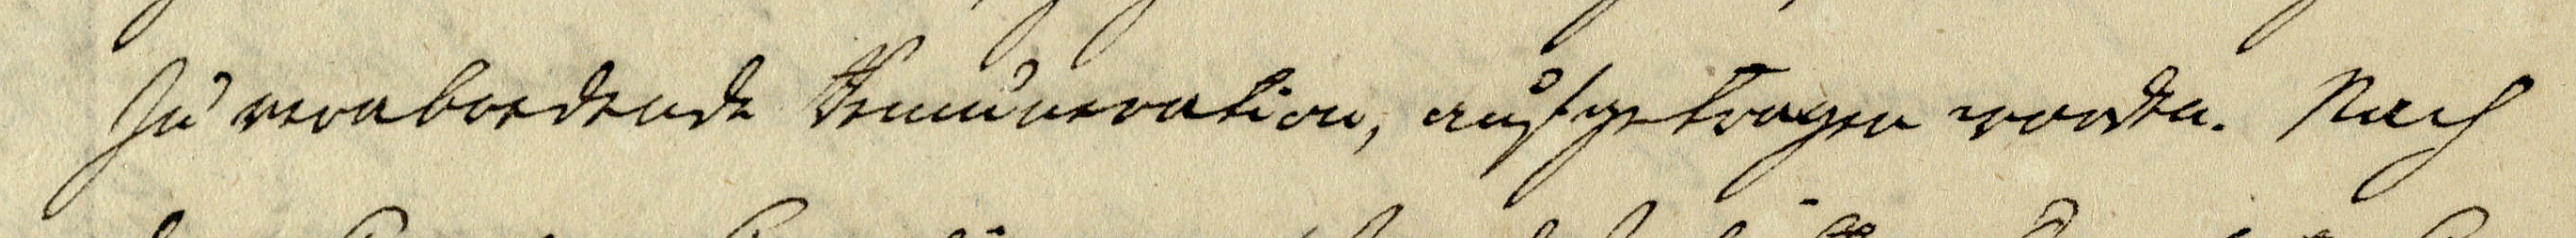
zu verabredende Remuneration, aufgetragen worden. Nach
